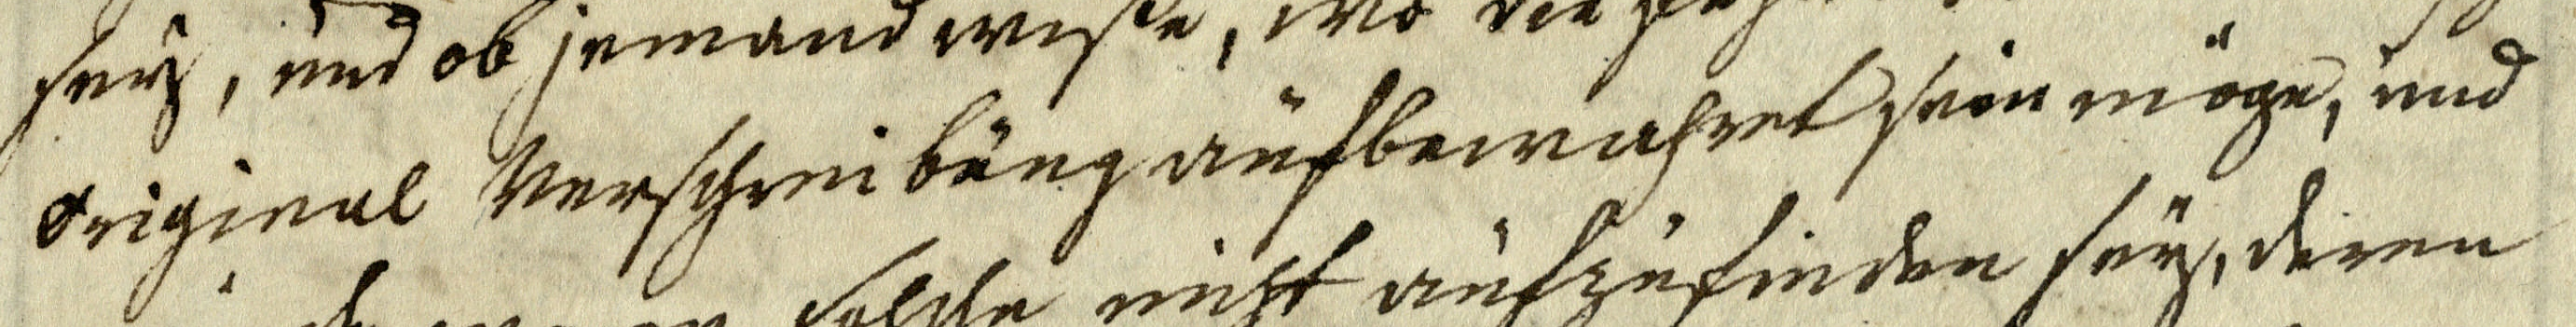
Original Verschreibung aufbewahret sein möge, und
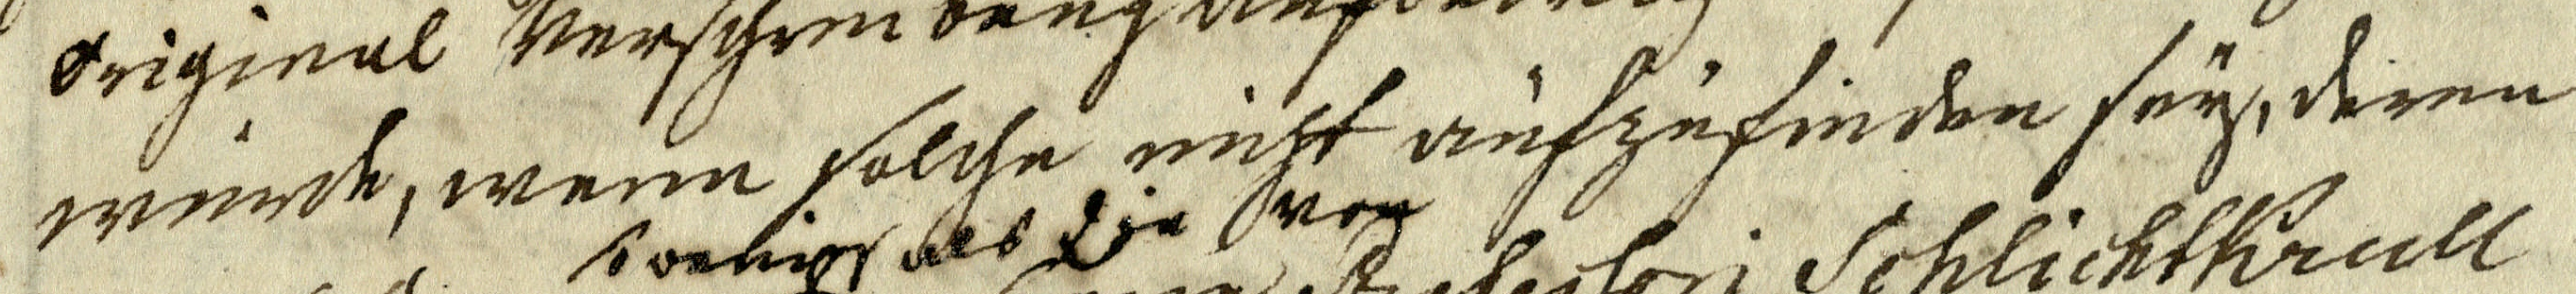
würde, wenn solche nicht aufzufinden seÿ, deren
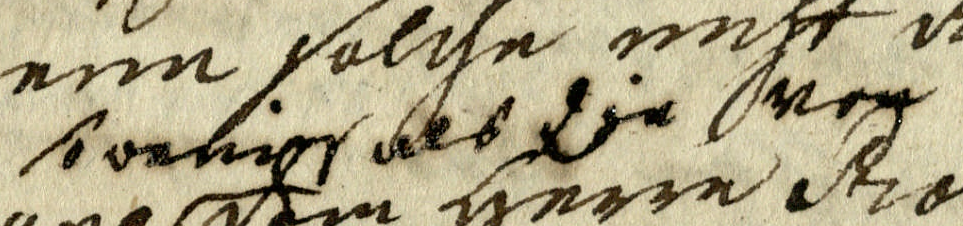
so wenig als die von
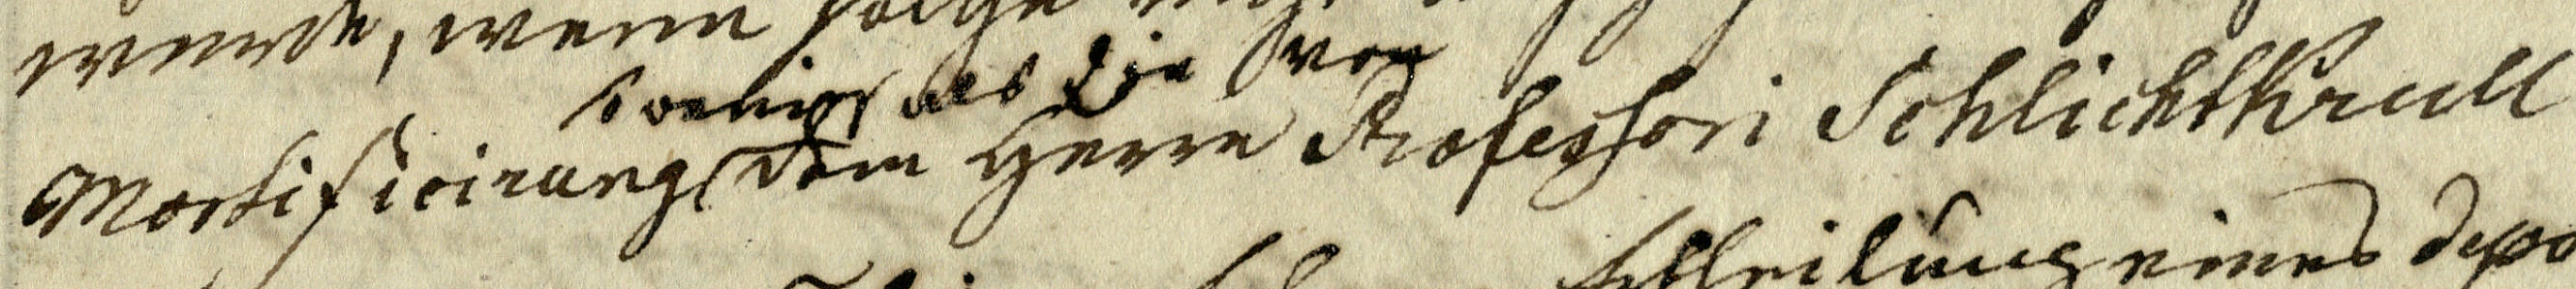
Mortificirung dem Herrn Professori Schlichtkrull
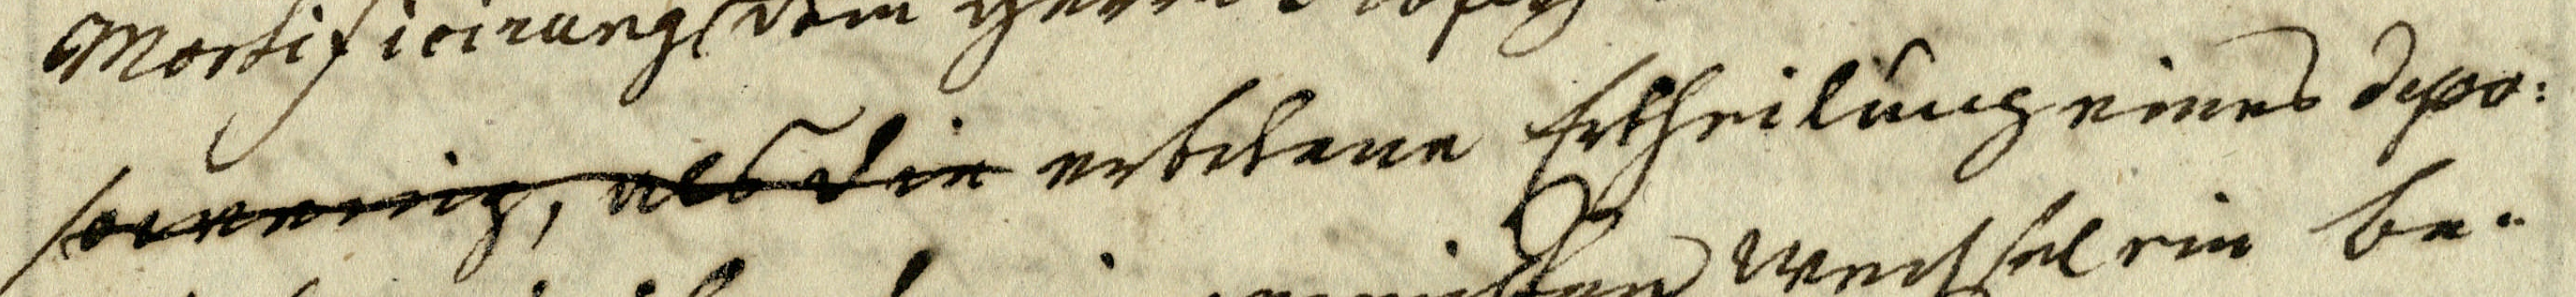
so wenig, als die erbetene Ertheilung eines depo¬
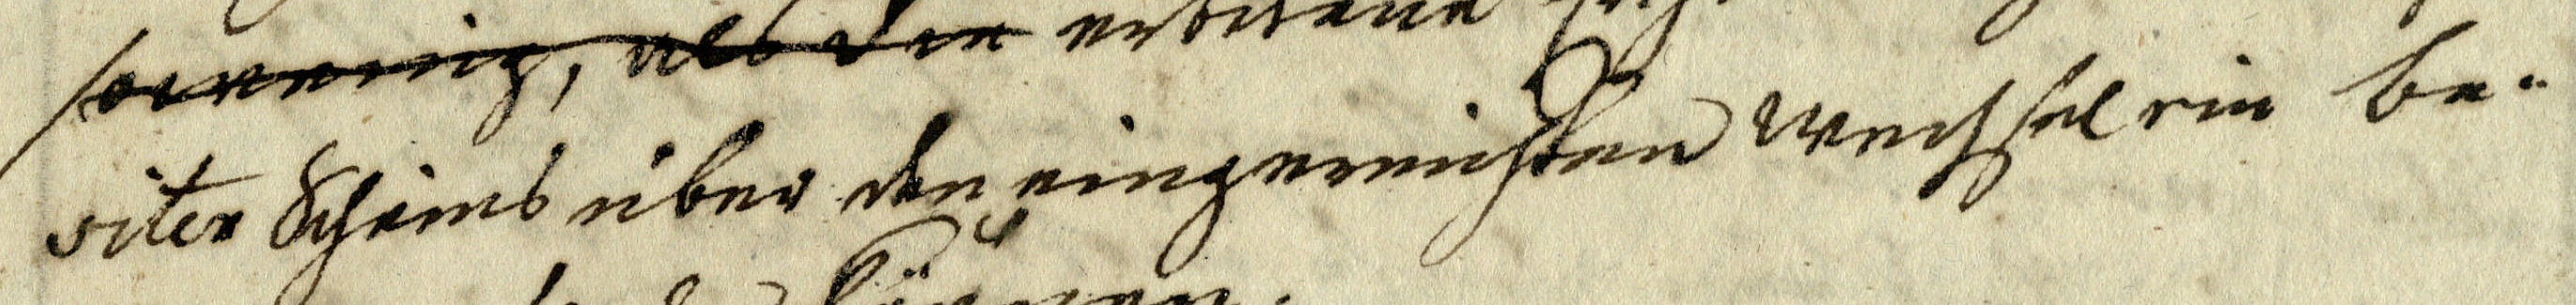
siten Scheins über den eingereichten Wechsel ein Be¬
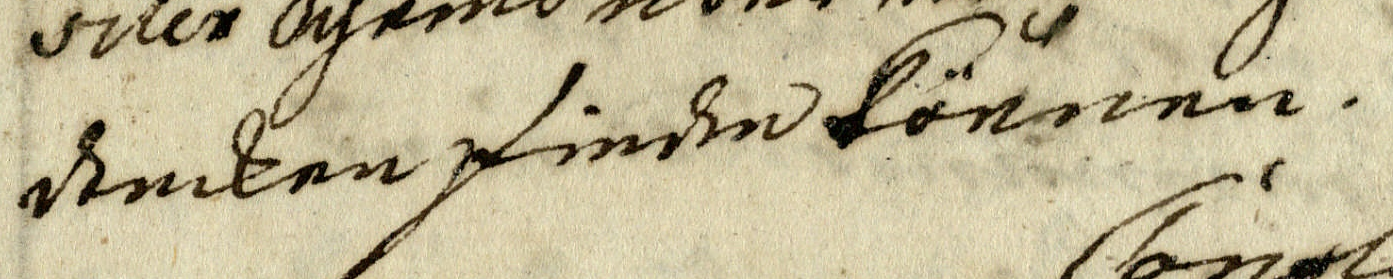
dencken finden können.
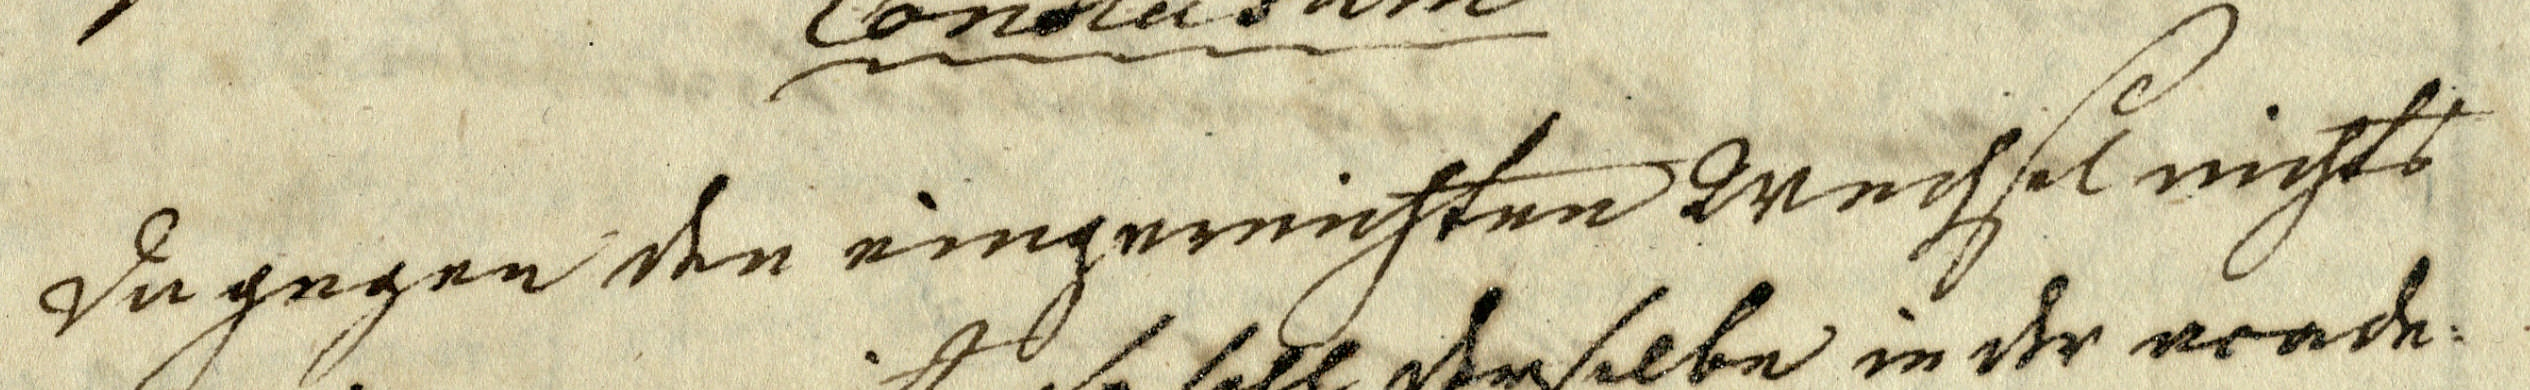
Da gegen den eingereichten Wechsel nichts
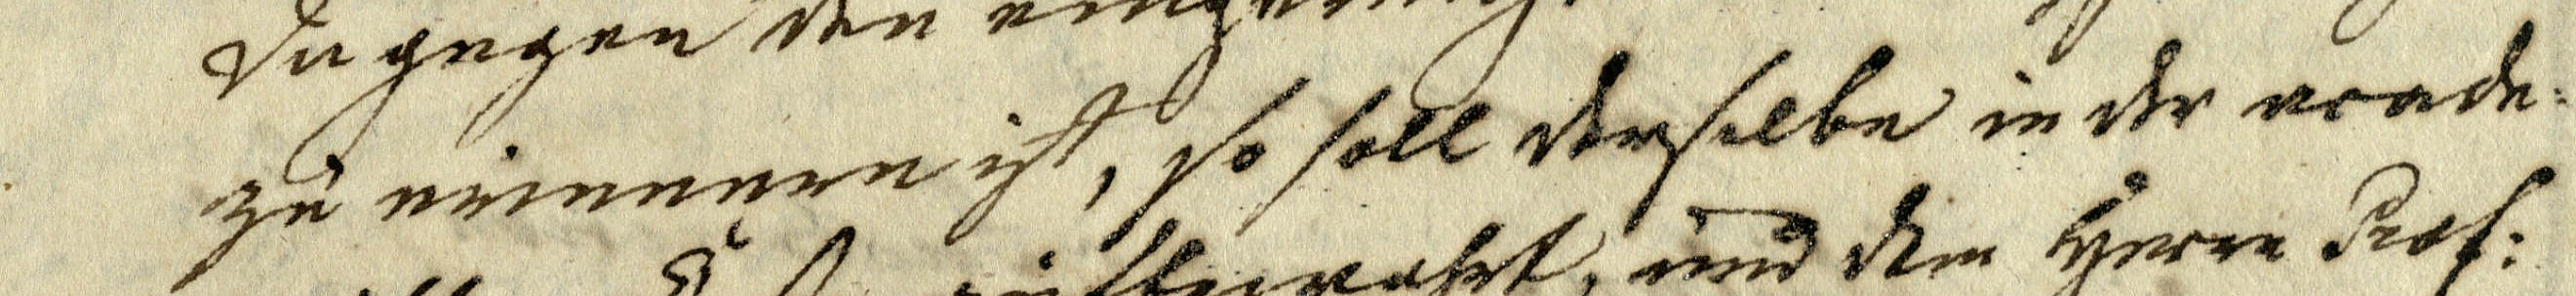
zu erinnern ist, so soll derselbe in der acade¬
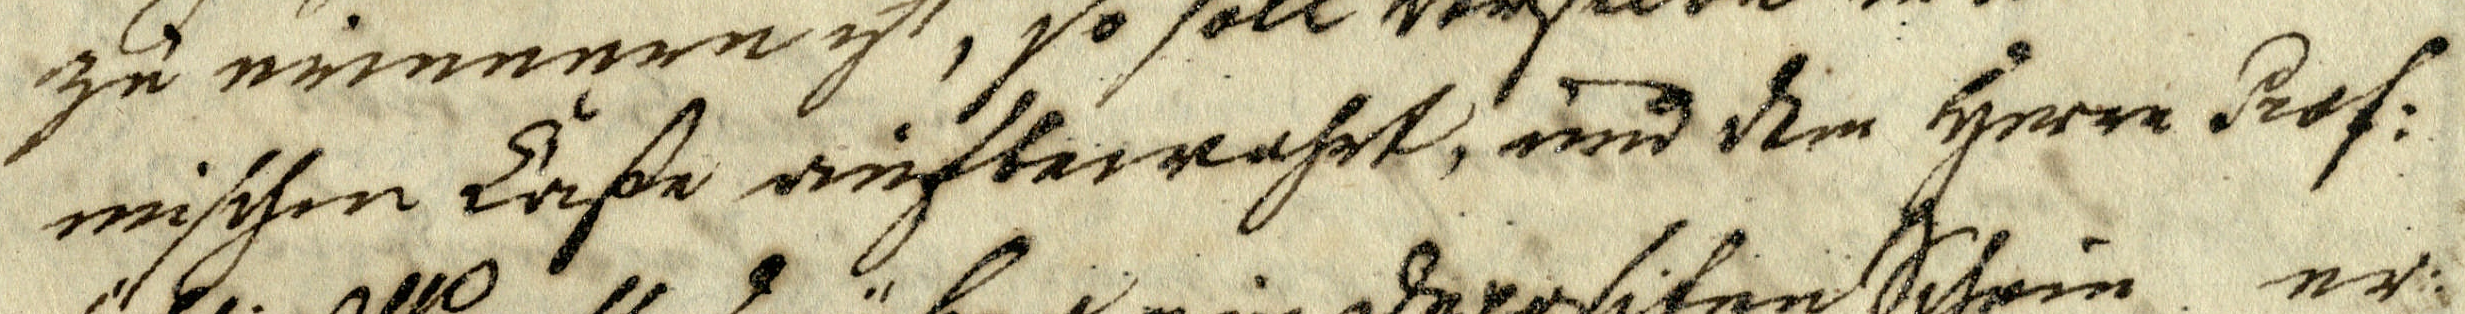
mischen Caße aufbewahrt, und dem Herrn Prof.
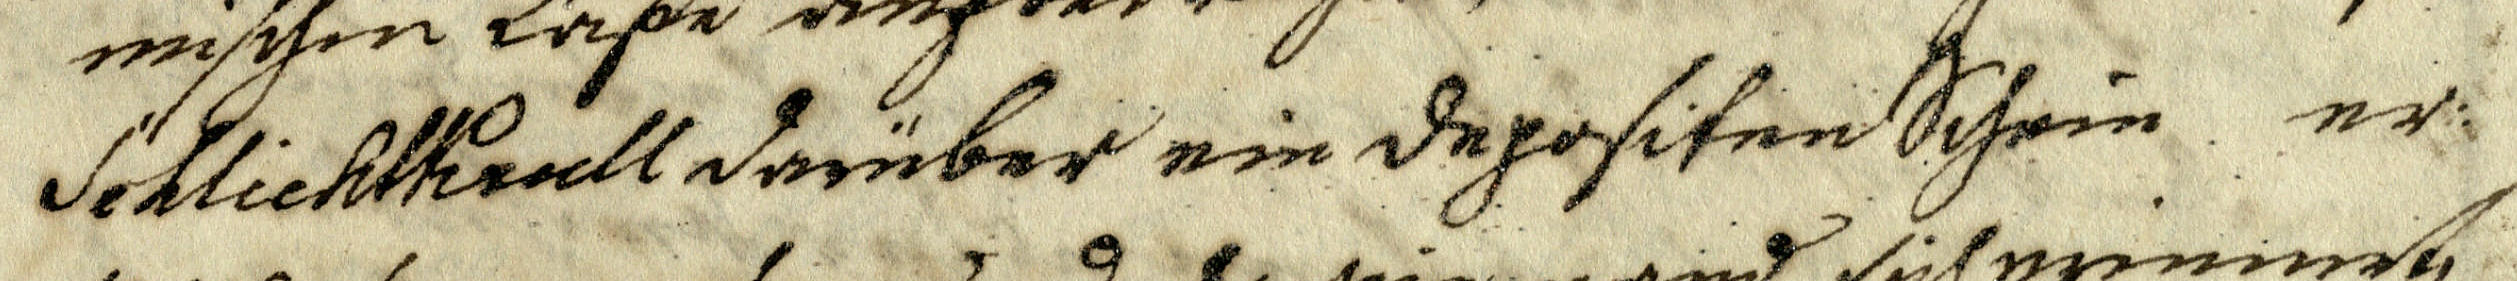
Schlichtkrull darüber ein Depositen Schein er¬
